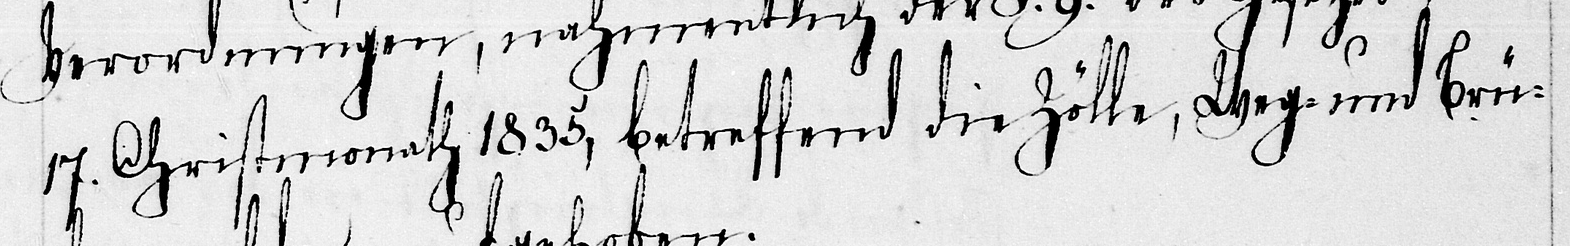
17. Christmonath 1835, betreffend die Zölle, Weg- und Brü¬
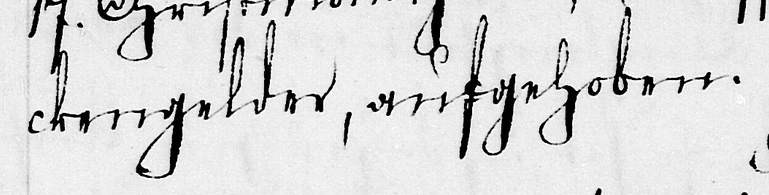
ckengelder, aufgehoben.
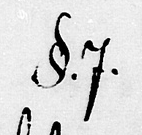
§. 7.
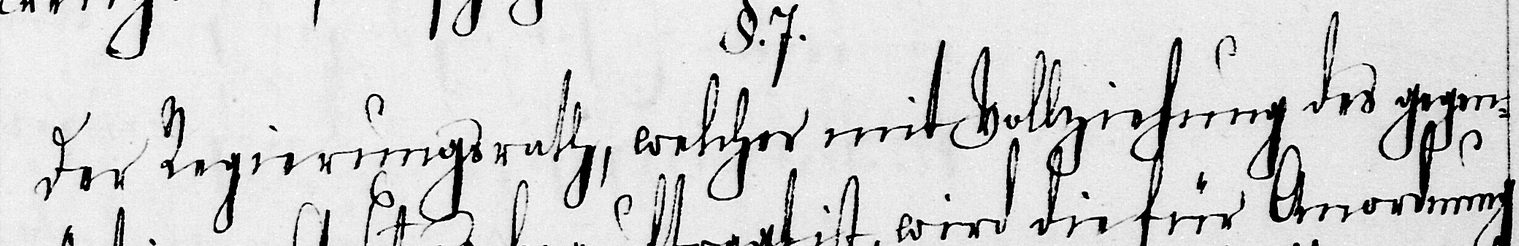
Der Regierungsrath, welcher mit Vollziehung des gegen¬
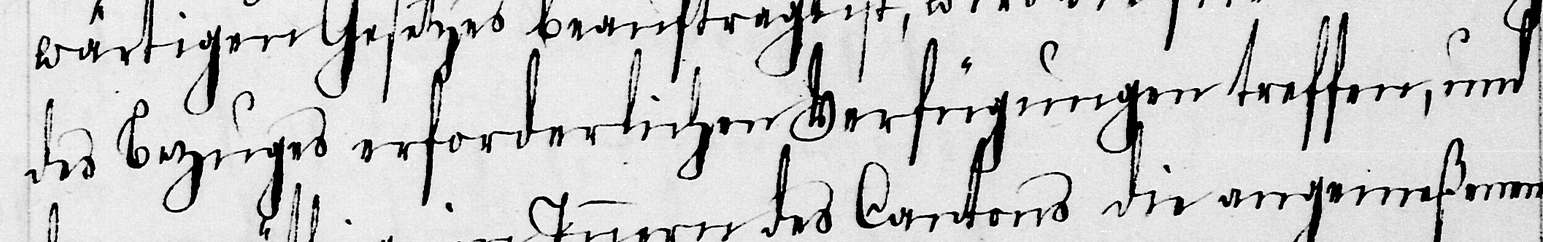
des Bezuges erforderlichen Verfügungen treffen, und
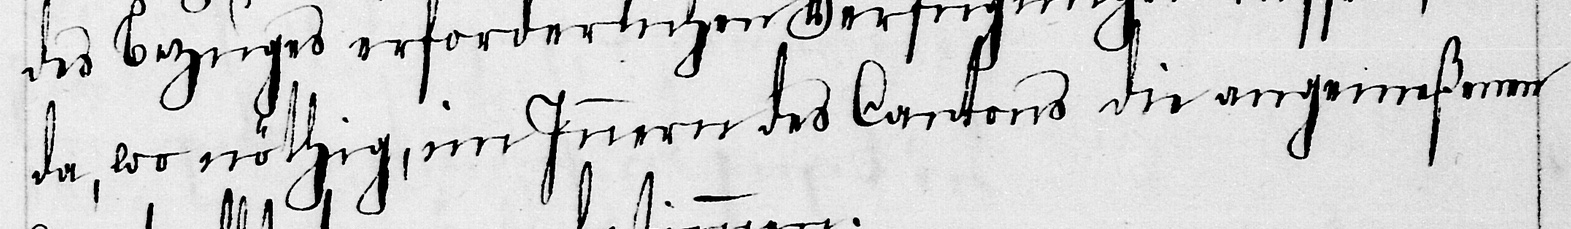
da, wo nöthig, im Innern des Cantons die angemeßenen
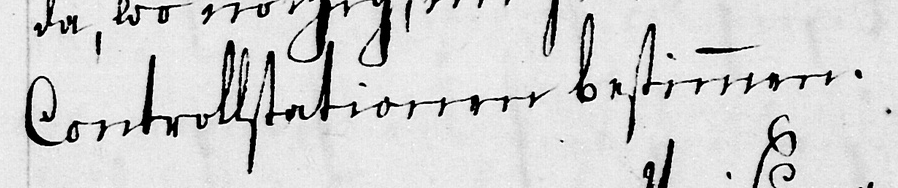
Controllstationen bestimmen.
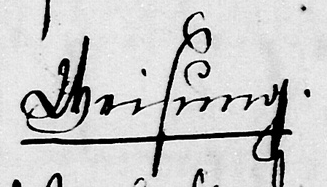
Weisung.
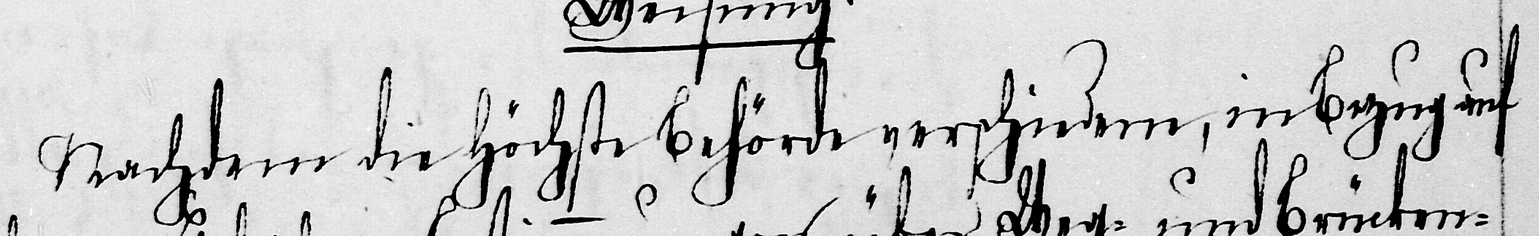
Nachdem die Höchste Behörde verschiedene, in Bezug auf
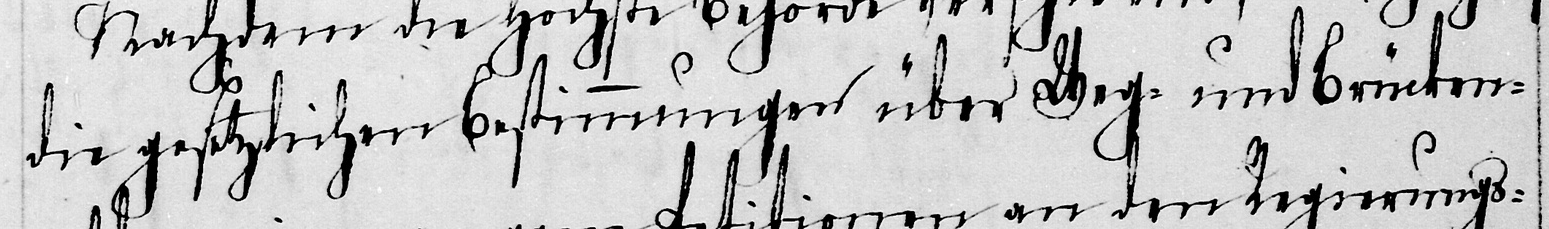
die gesetzlichen Bestimmungen über Weg- und Brücken¬
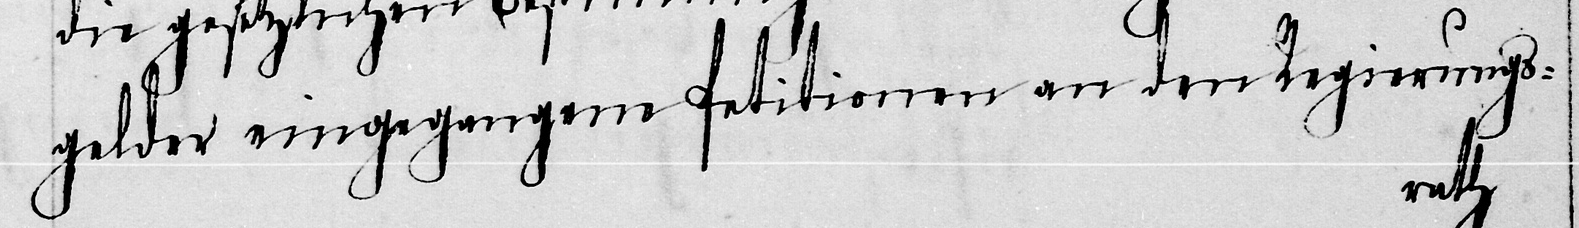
gelder eingegangene Petitionen an den Regierungs-
